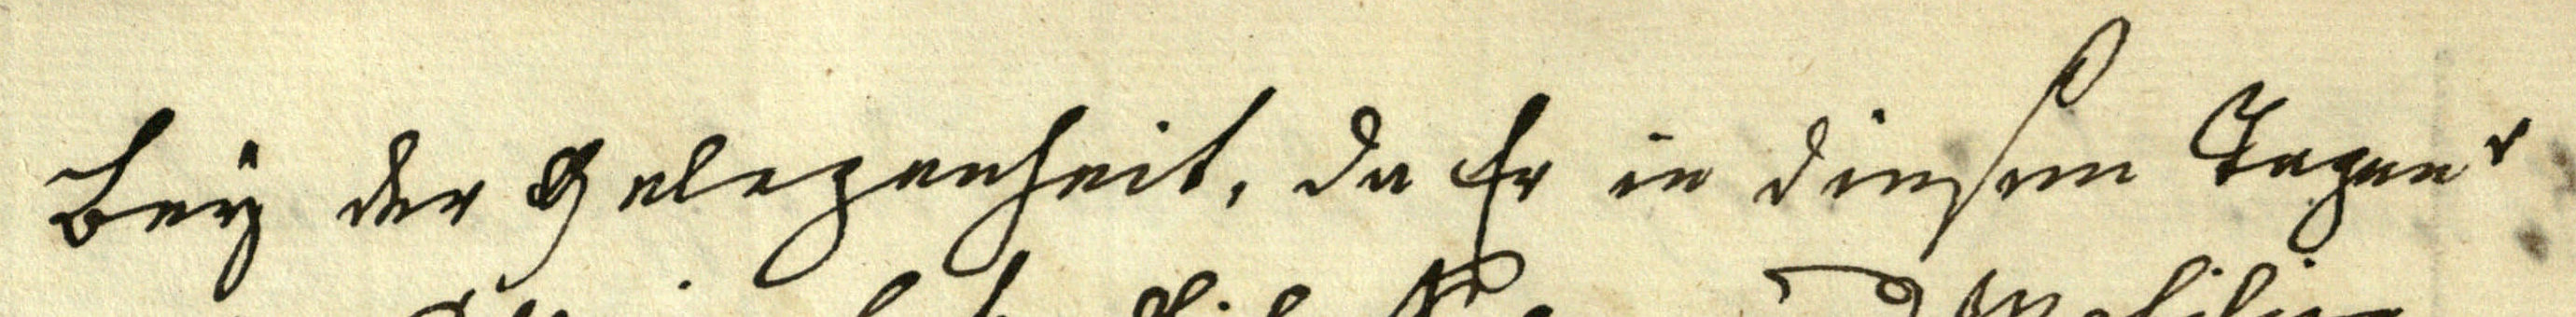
Beÿ der Gelegenheit, da Er in diesen Tagen
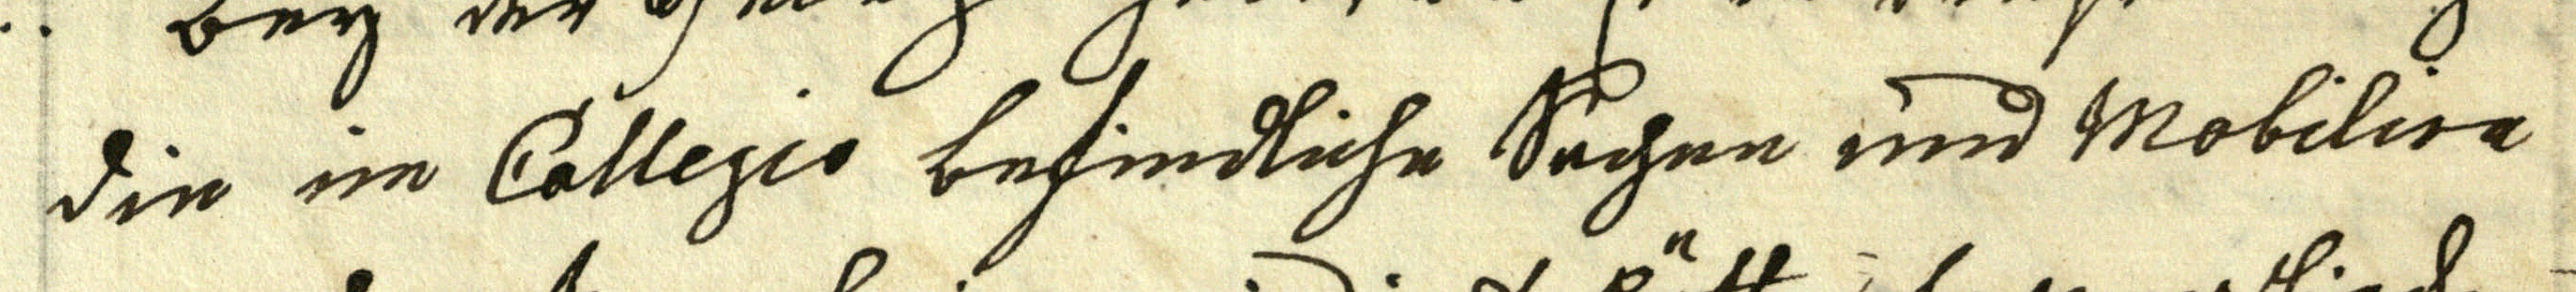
die im Collegio befindliche Sachen und Mobilien
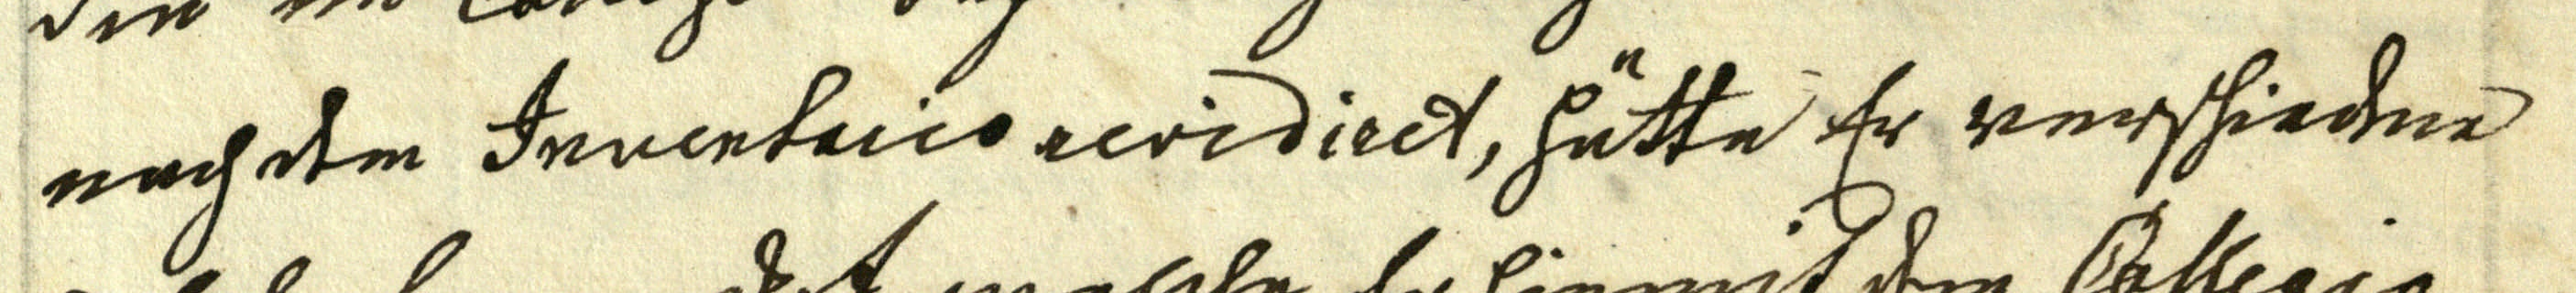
nach dem Inventario revidiret, hätte Er verschiedene
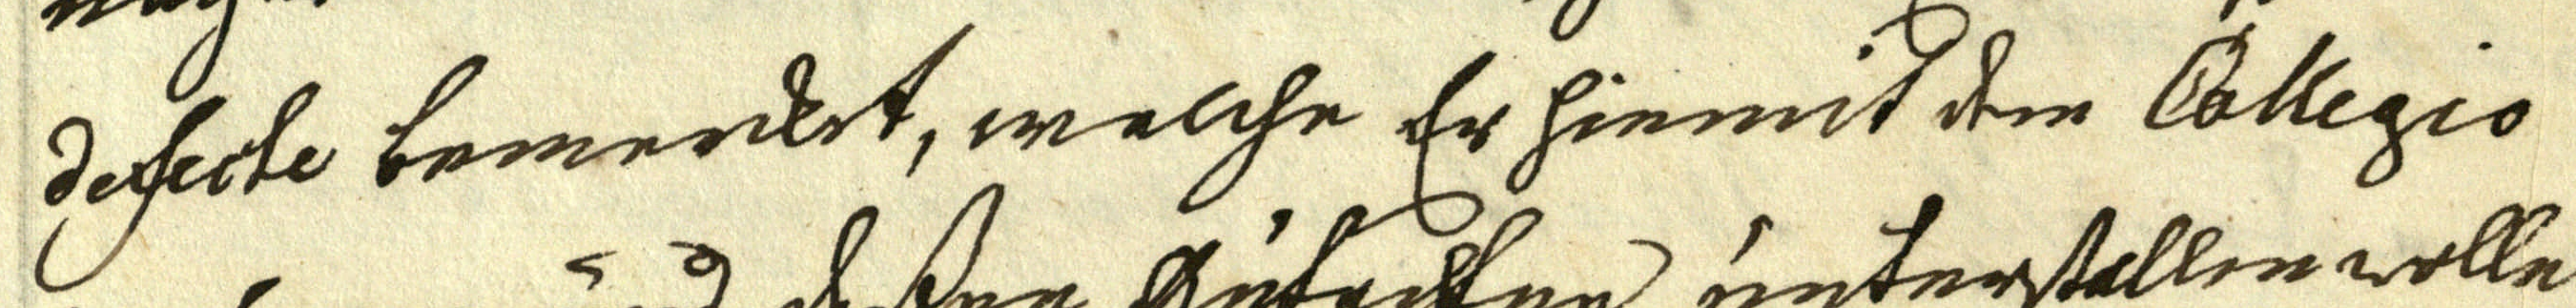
defecte bemercket, welche Er hiemit dem Collegio
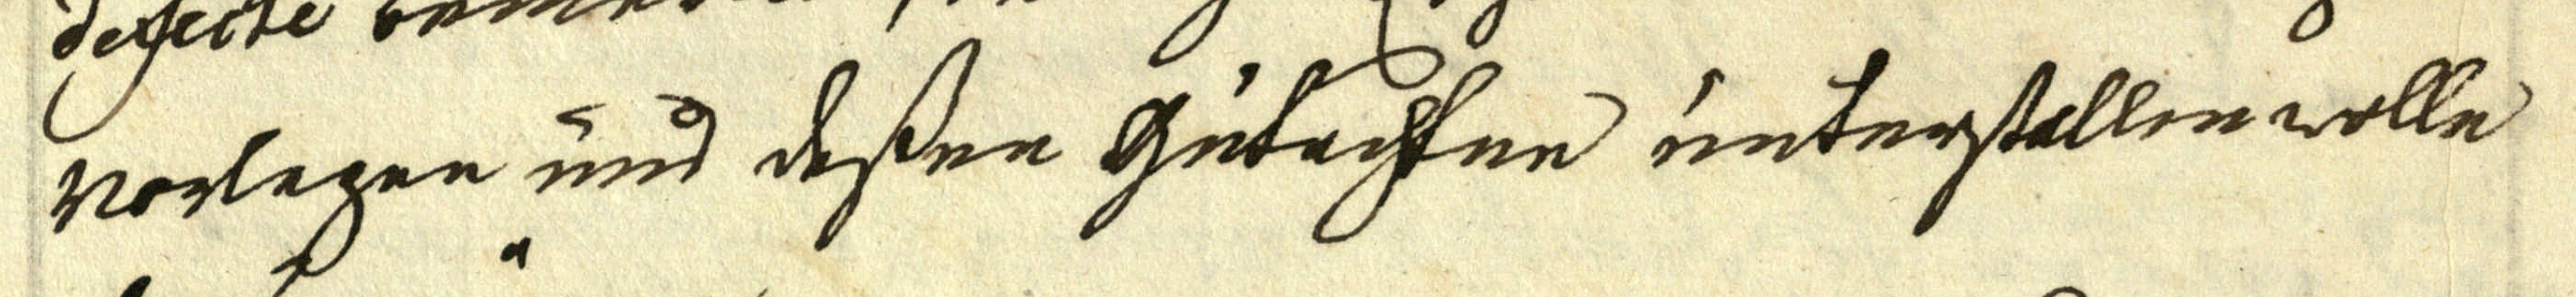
vorlegen und deßen Gutachten unterstellen wolle
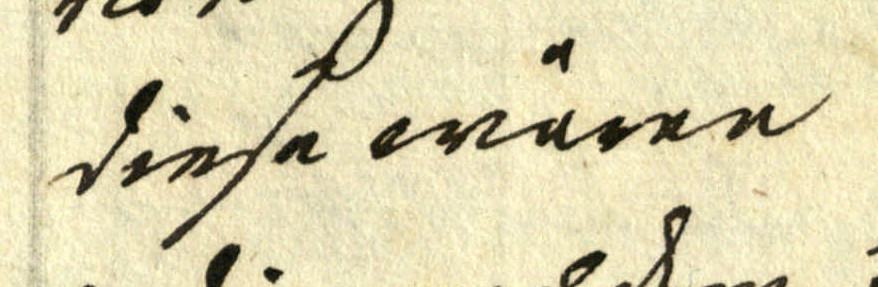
diese wären
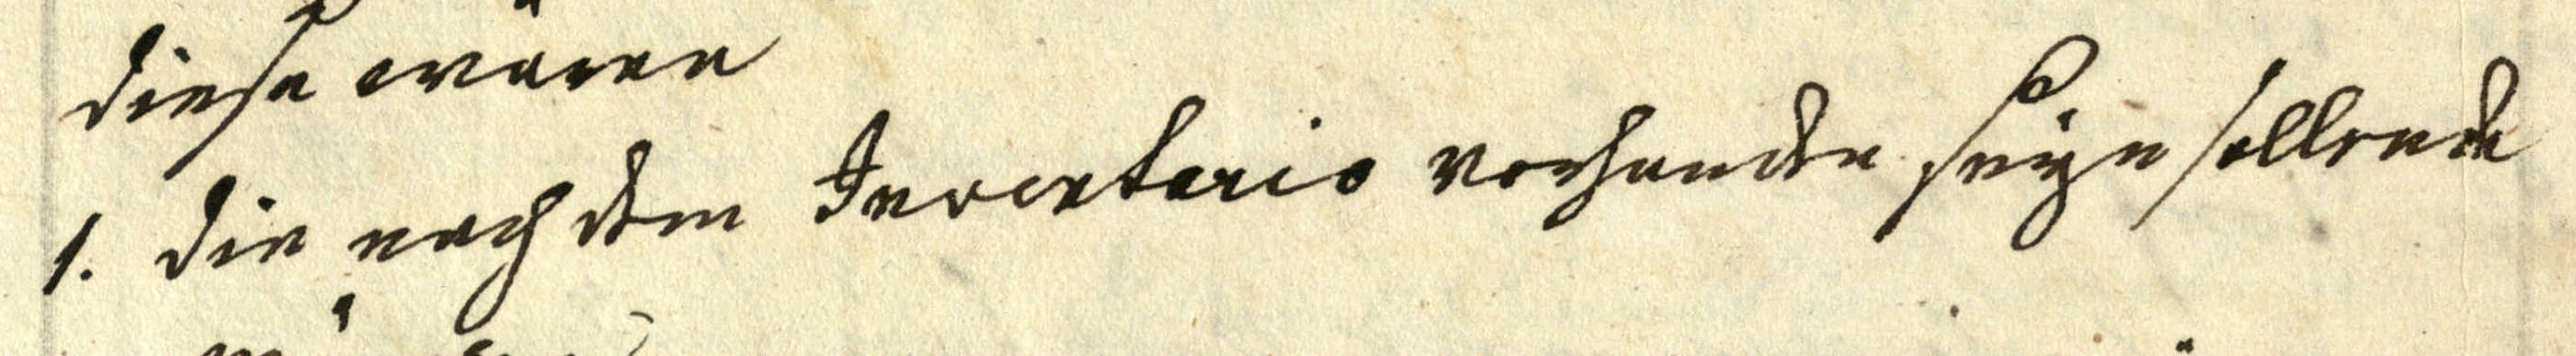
1. die nach dem Inventario vorhanden seÿn sollende
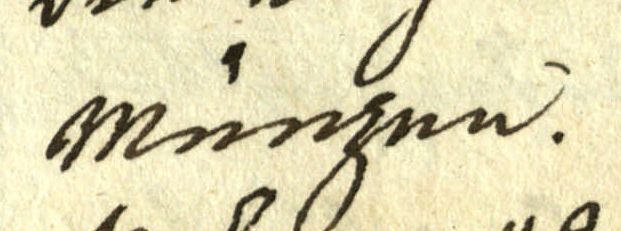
Münzen.
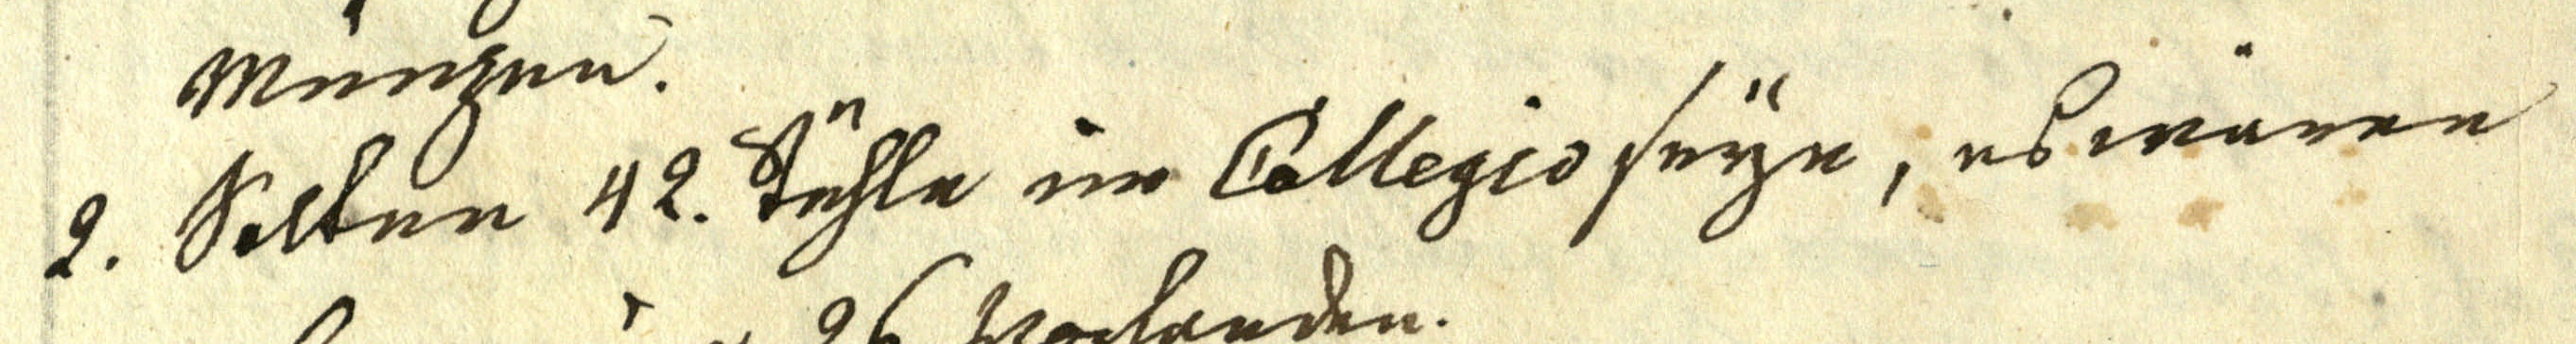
2. Solten 42. Stühle im Collegio seÿn, es wären
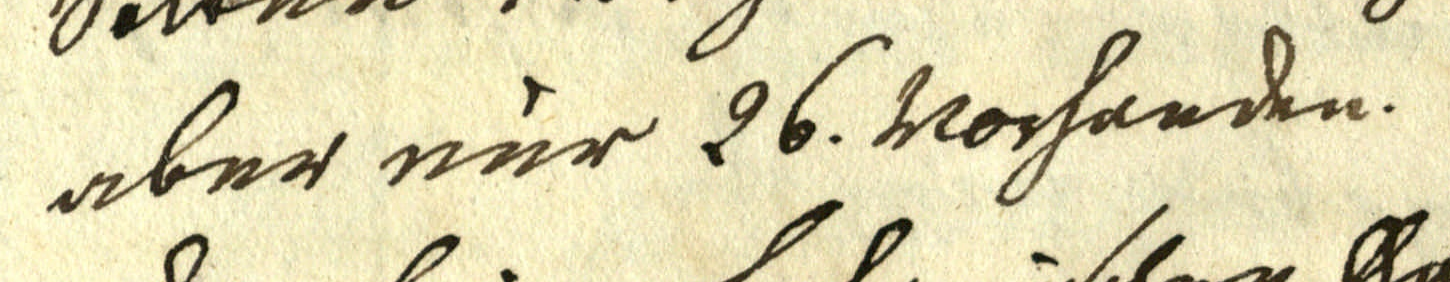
aber nur 26. vorhanden.
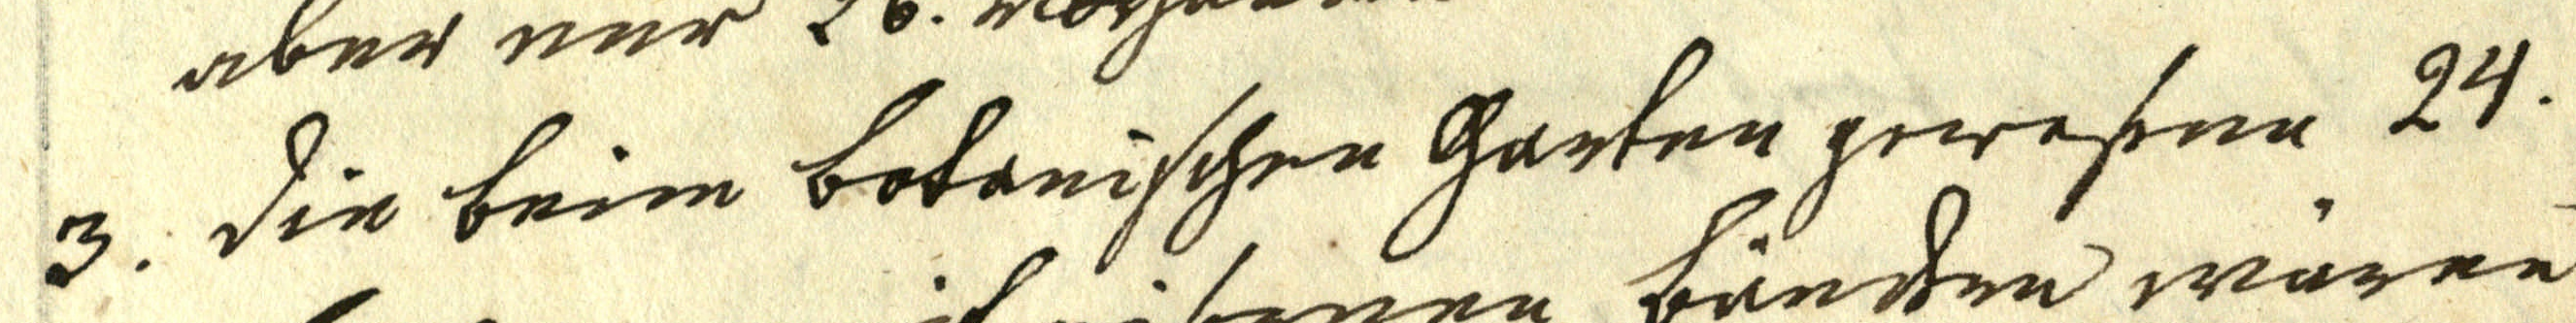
3. die beim botanischen Garten gewesene 24.
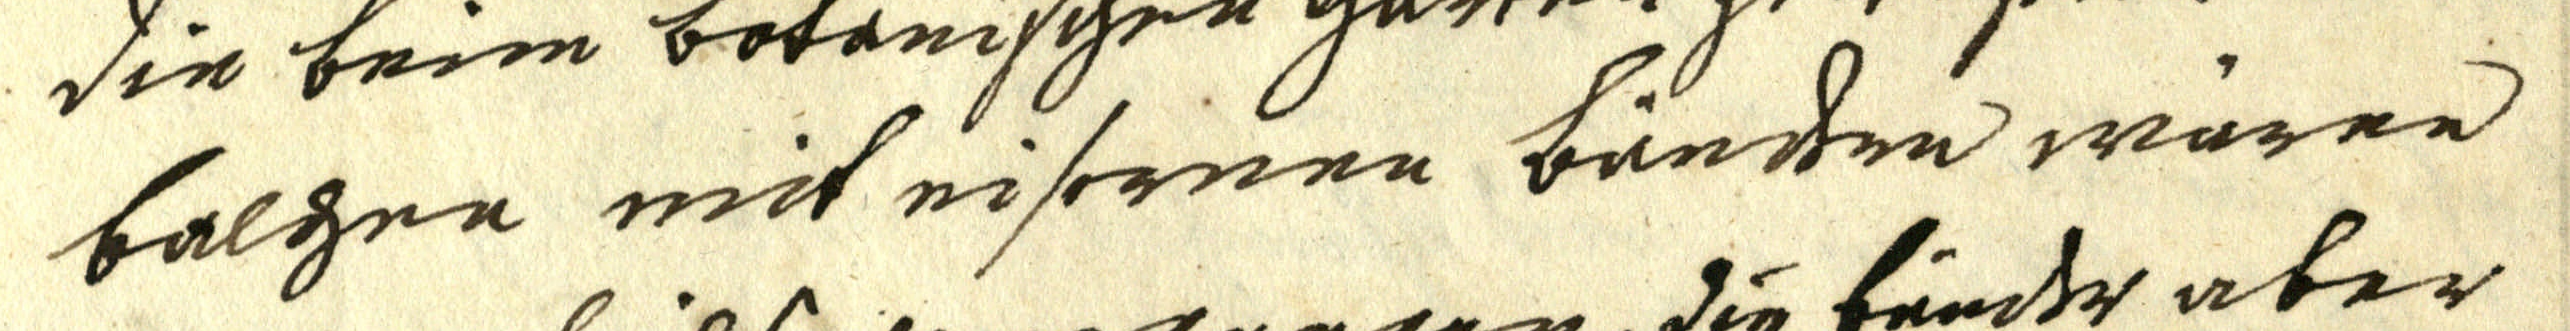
Balgen mit eisernen Bändern wären
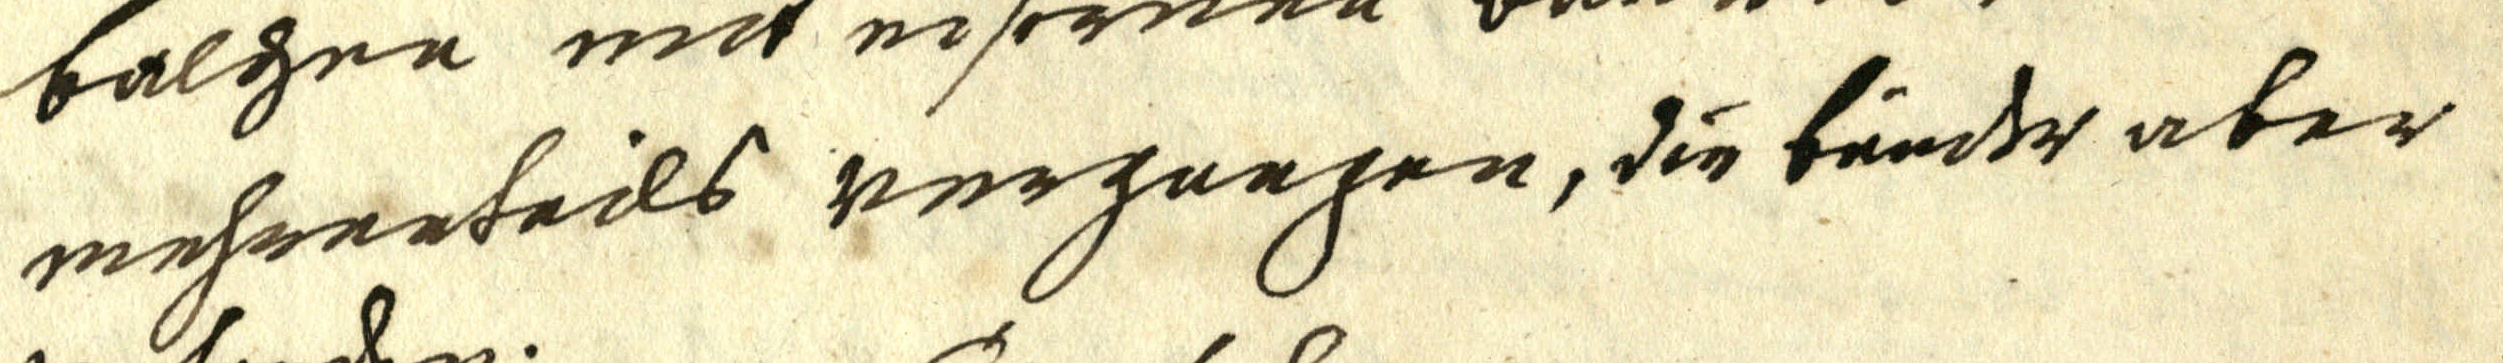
mehrenteils vergangen, die Bänder aber
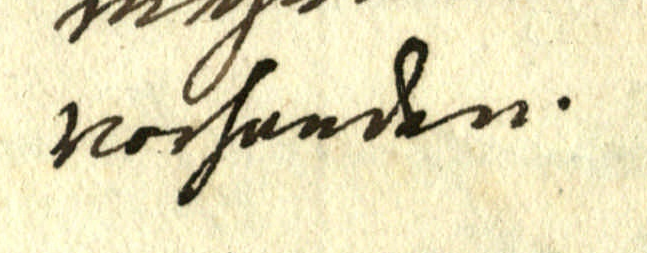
vorhanden.
